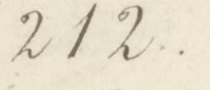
212
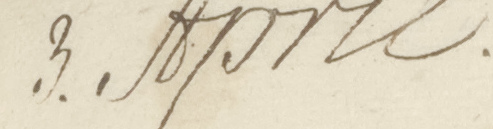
3. April.
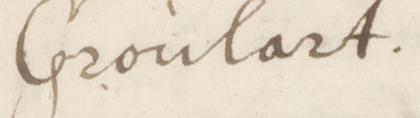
Groulart.
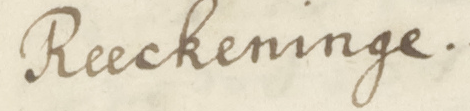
Reeckeninge.
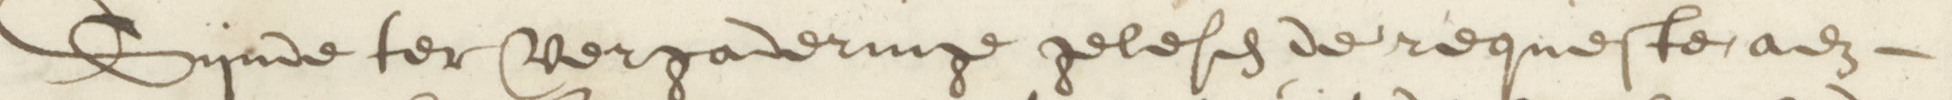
Sijnde ter vergaderinge gelesen de requeste aen —
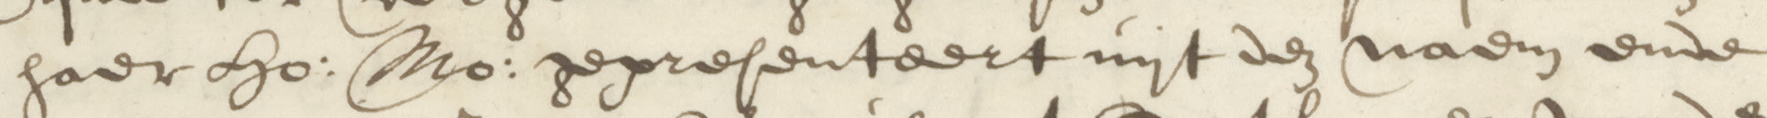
haer Ho:Mo: gepresenteert uijt den naem ende
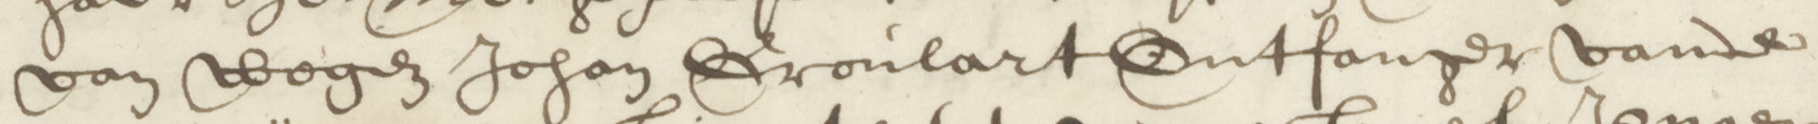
van wegen Johan Groulart Ontfanger vande
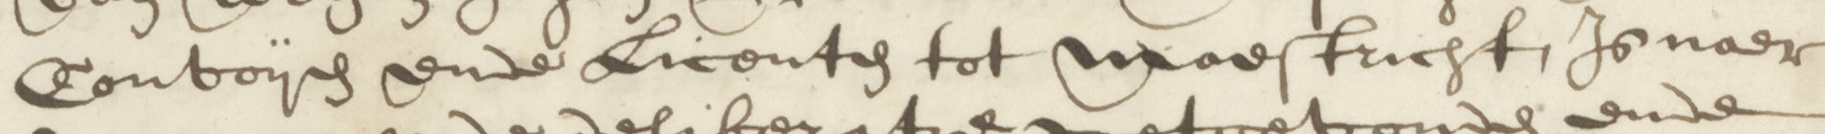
Convoijen ende Licenten tot Maestricht. Is naer
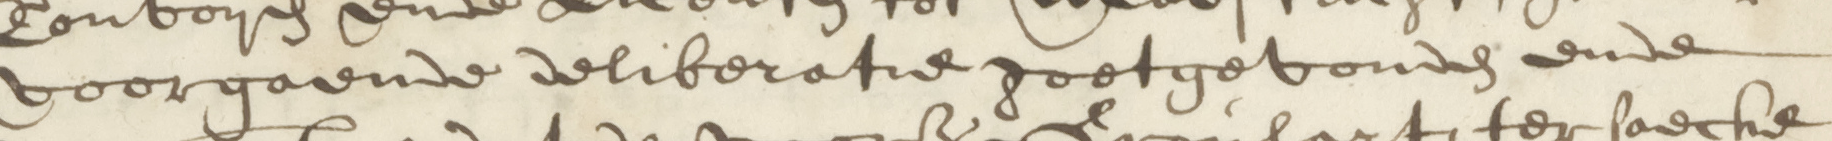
voorgaende deliberatie goetgevonden ende
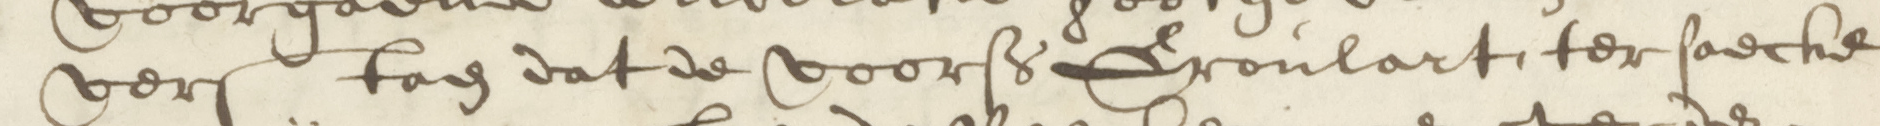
verstaen dat de voorsz Groulart, ter saecke
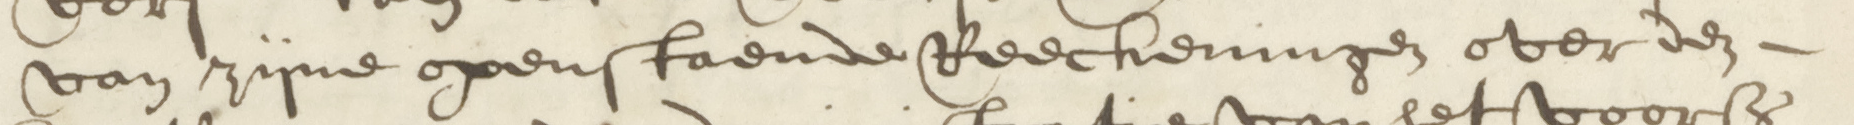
van zijne openstaende Reeckeningen over den —
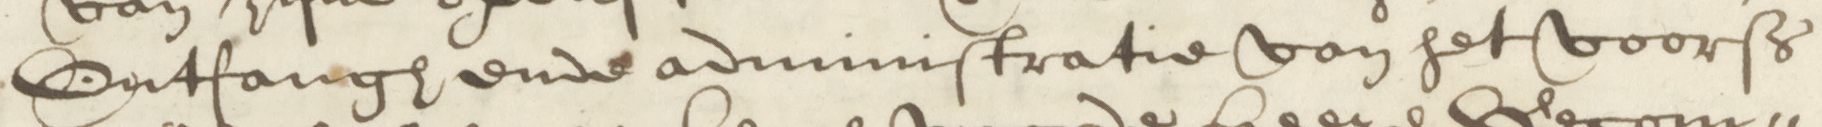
Ontfangh ende administratie van het voorsz
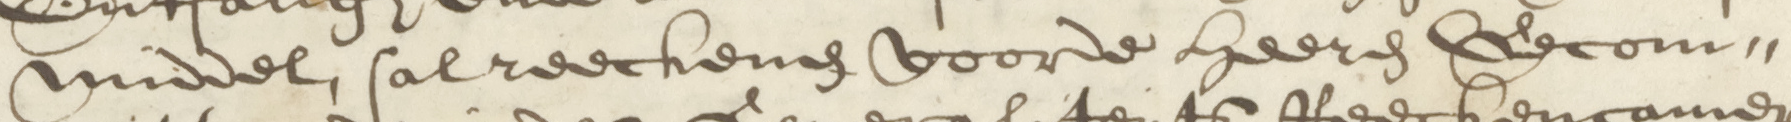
middel, sal reeckenen voorde heeren Gecom„
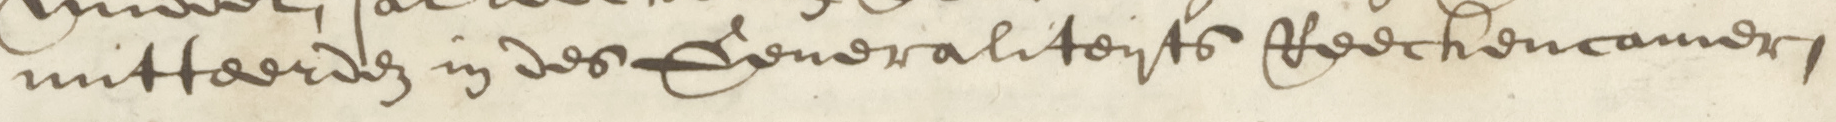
mitteerden in des Generaliteijts Reeckencamer.
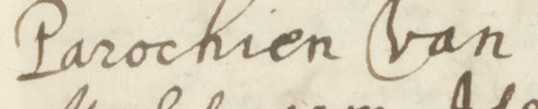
Parochien van
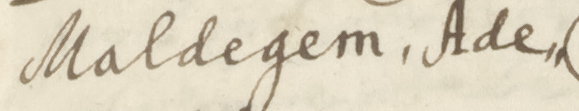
Maldegem, Ade„
